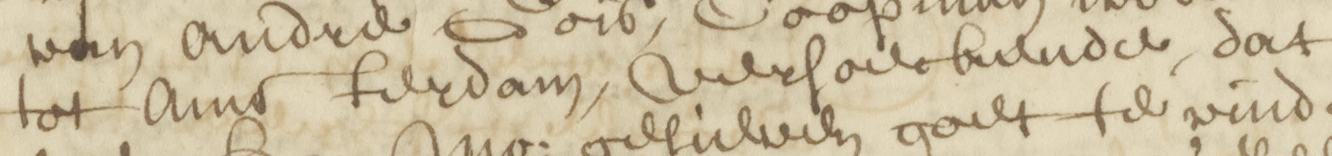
tot Amsterdam, versoeckende, dat
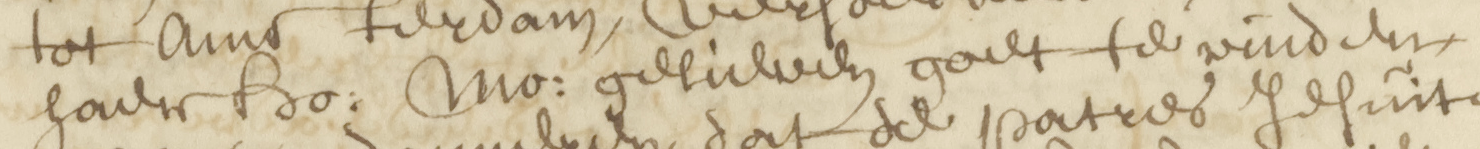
haer Ho:Mo: gelieven goet te vinden,
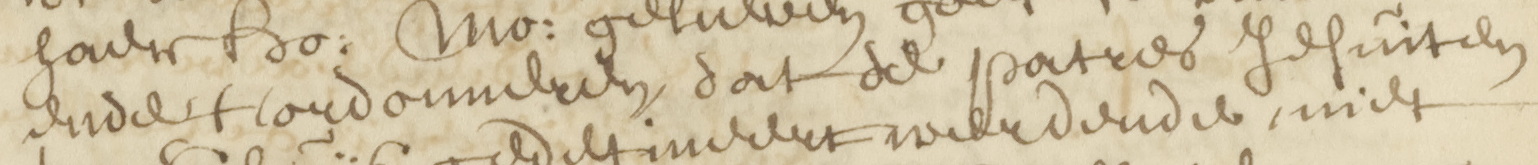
ende t‛ordonneren, dat de patres Jesuiten
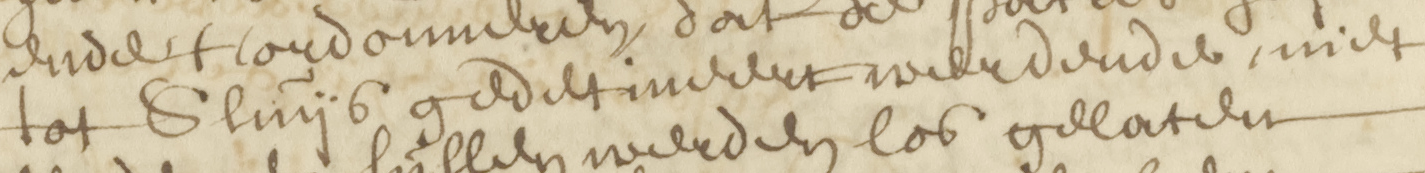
tot Sluijs gedetineert werdende, niet
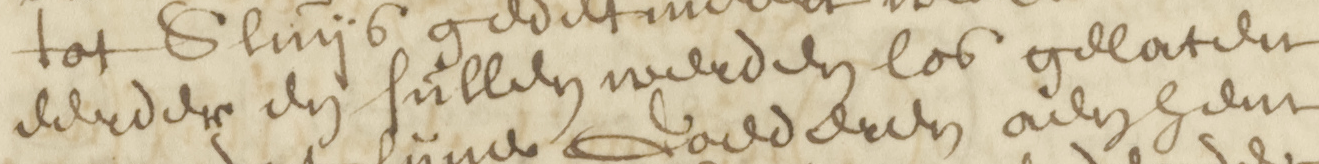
eerder en sullen werden los gelaten
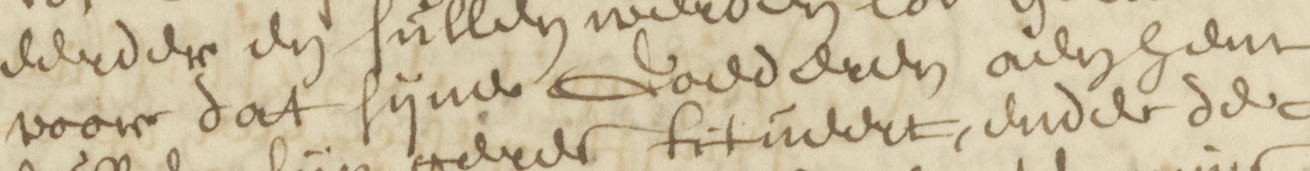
voor dat sijne Goederen aen hem
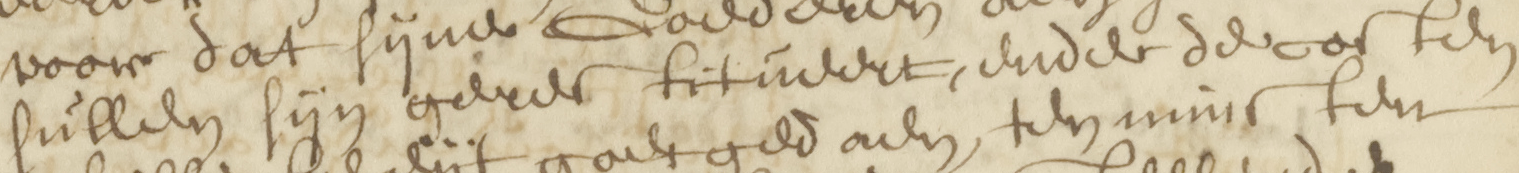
sullen sijn gerestitueert, ende de costen
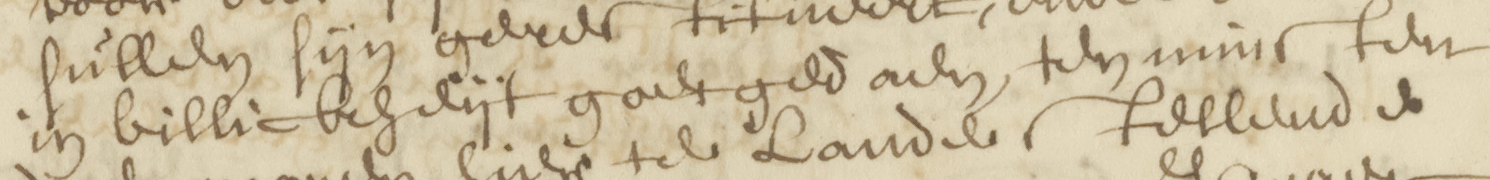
in billickheijt goetgedaen, ten minsten
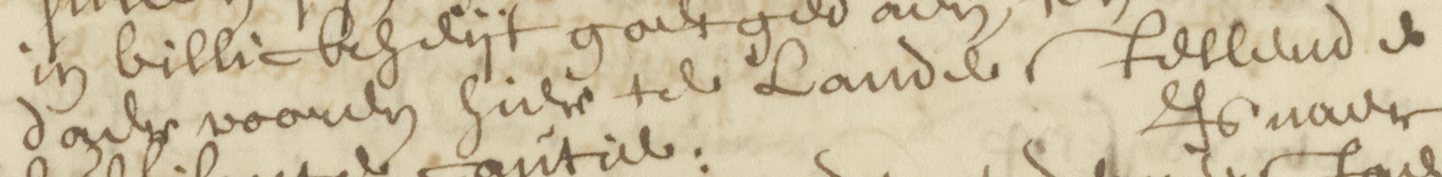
daer vooren hier te Lande stellende
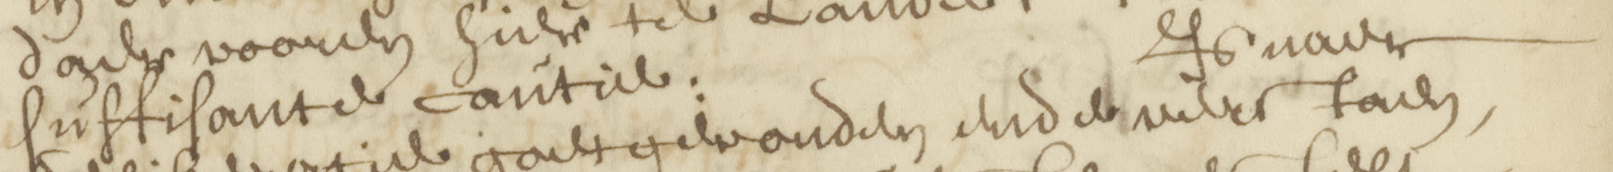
suffisante cautie: Is naer
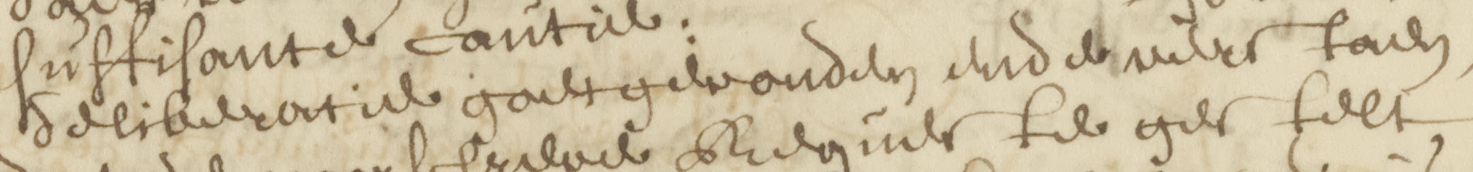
deliberatie goetgevonden ende verstaen,
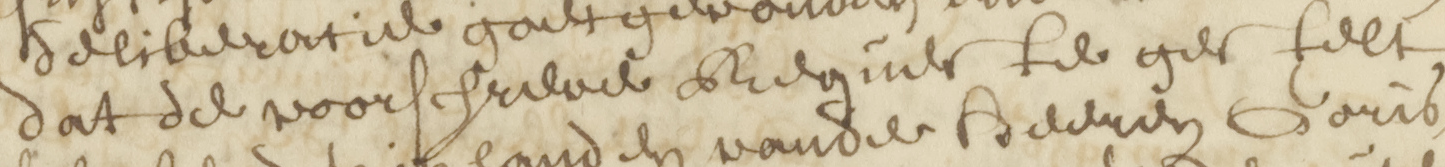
dat de voorschreve Requeste gestelt
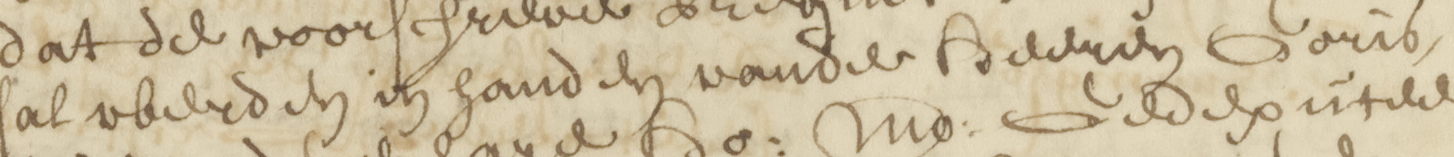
al werden in handen vande Heeren Goris,
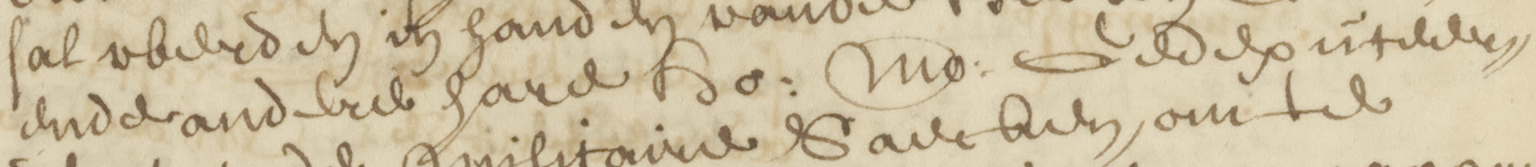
ende andere hare Ho:Mo: Gedeputeer„
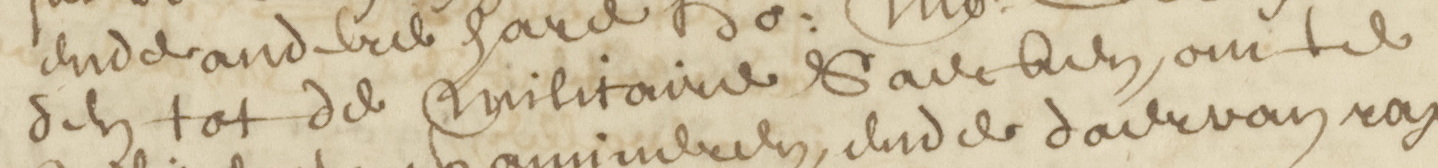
den tot de Militaire Saecken, om te
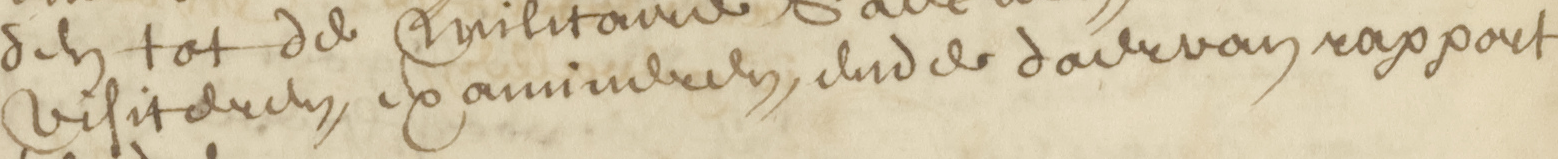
visiteren, examineren, ende daervan rapport
